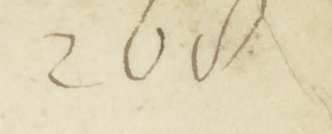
268
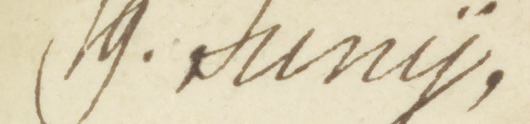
19. Junij.
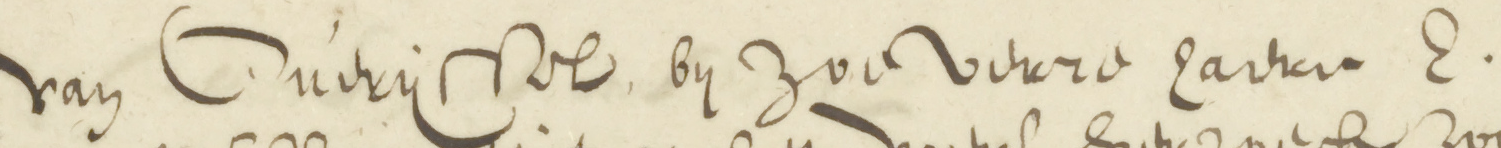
van Overijssel, by zoeverre haere E.
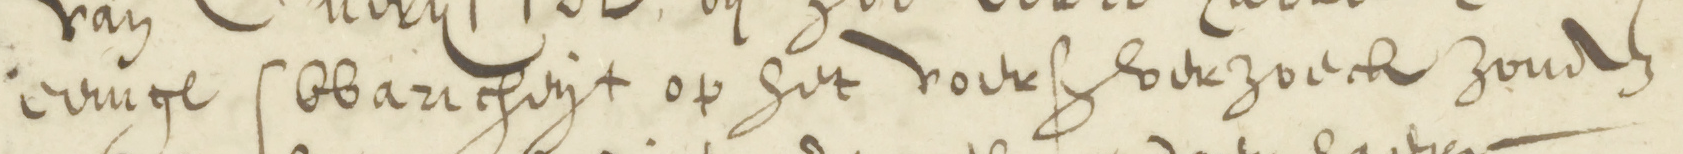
eenige swaricheijt op het voers verzoeck zouden
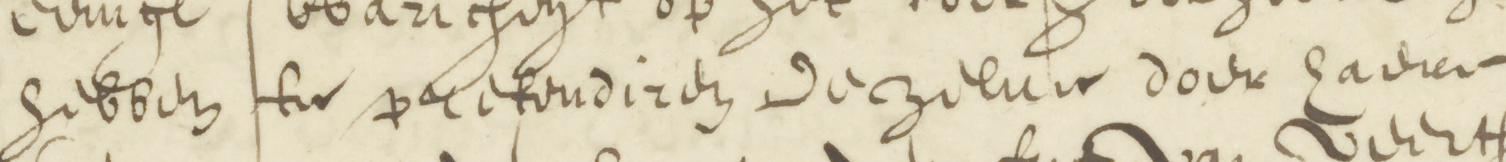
hebben te pretendiren de zelue doer haere
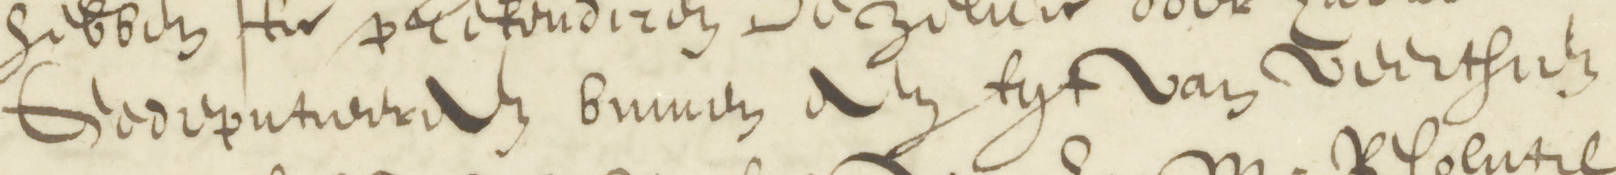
Gedeputieerden binnen den tyt van veerthien
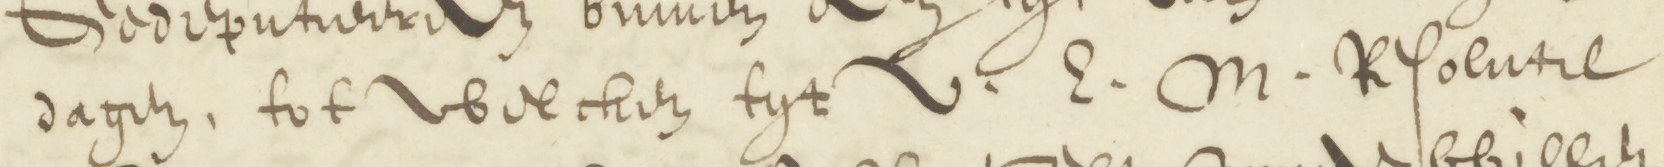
dagen, tot welcken tyt U. E. M. Resolutie
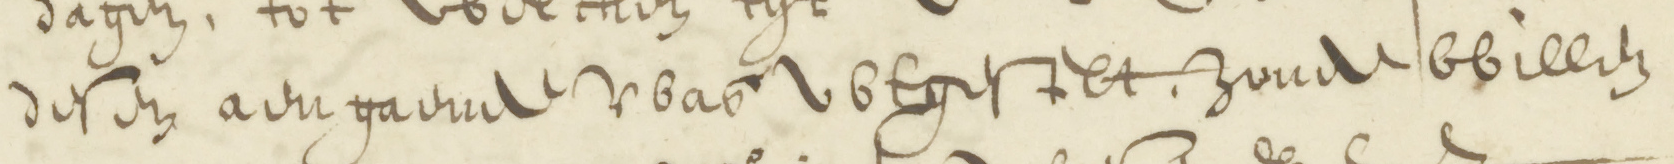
desen aengaende was Wtgestelt. Zoude willen
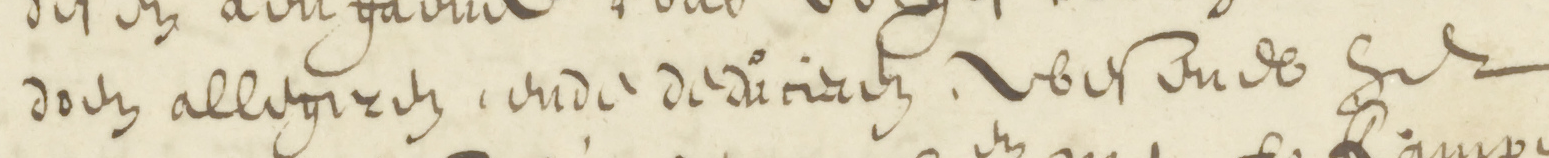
doen allegiren, ende dediciren, wesende het
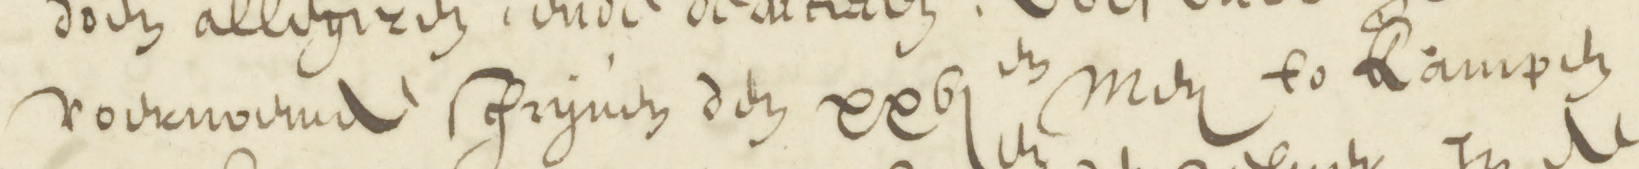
voernoemde schrijuen den xxvien Mey to Kampen
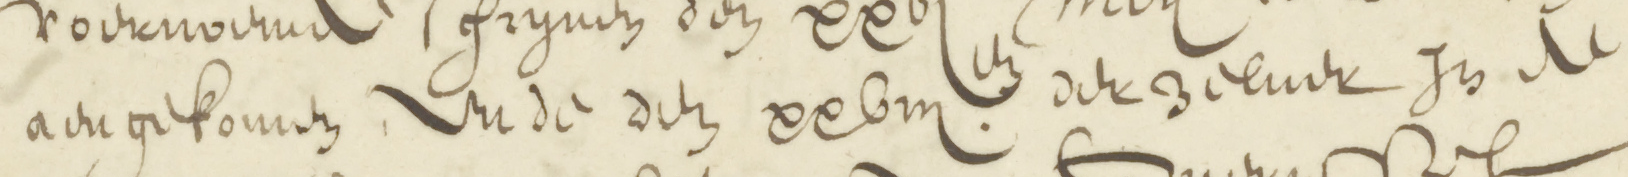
aengekomen, ende den xxvije der zelver In de
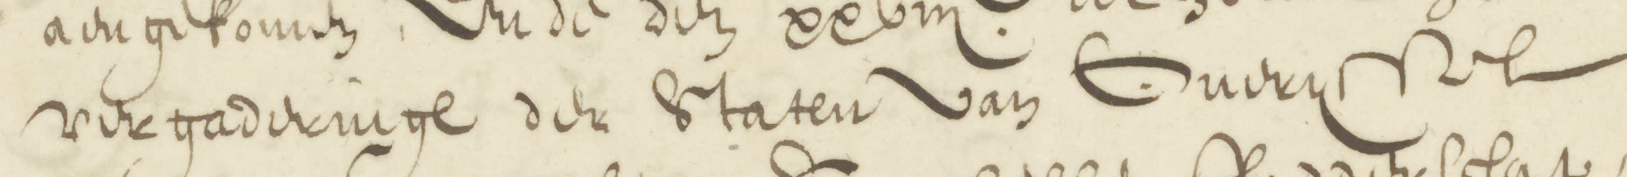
vergaderinge der Staten van Oueryssel
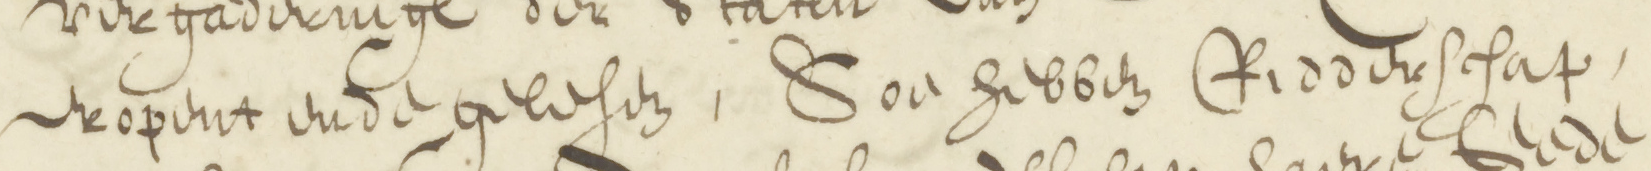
eropent ende gelesen. Soe hebben Ridderschap,
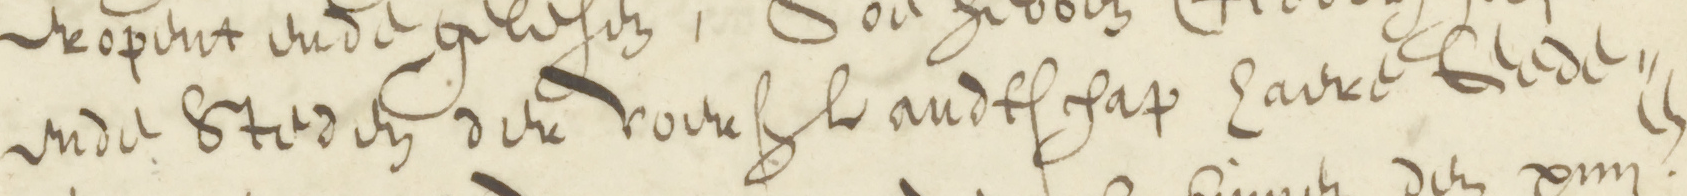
ende Steden der voers Landtschap haere Gede„
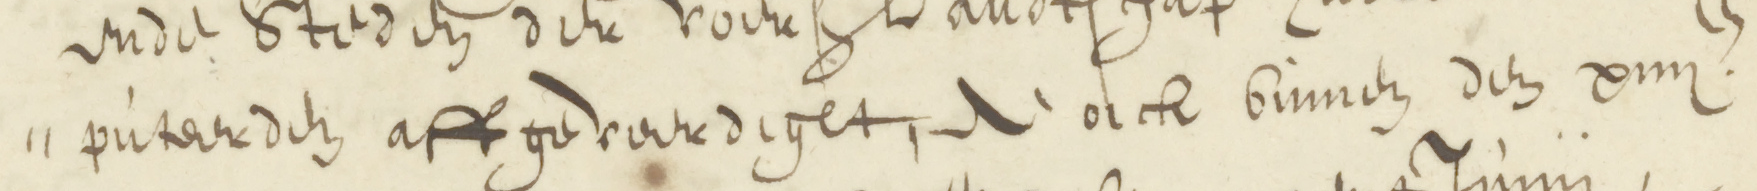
„puteerden affgeveerdight, die oick binnen den xiiije.
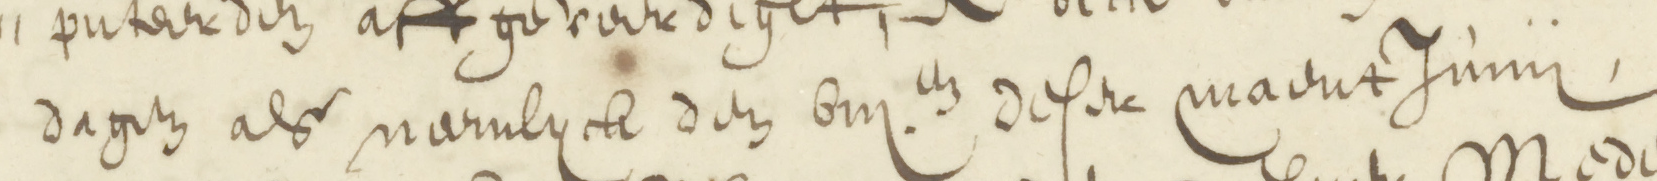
dagen als naemlyck den viii.en deser maent Junij
